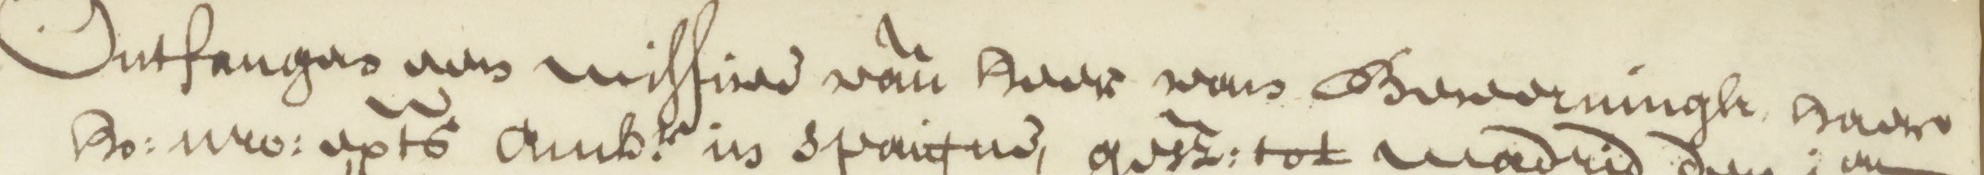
Ontfangen een missive van Heer van Beverningh haer
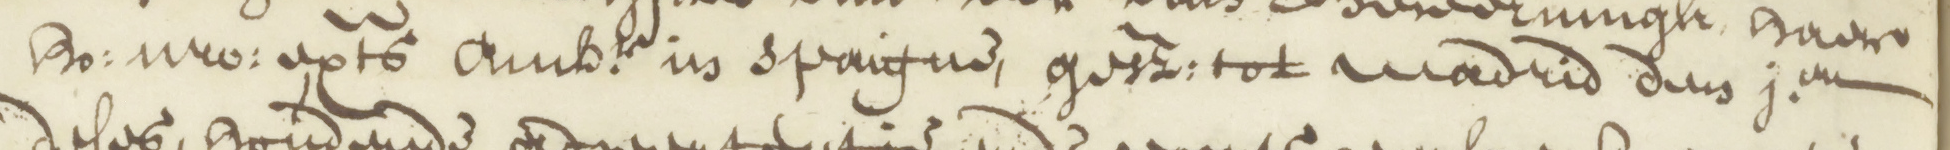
Ho:Mo: exts Ambr. in spaigne, gesr. tot madrid den ien
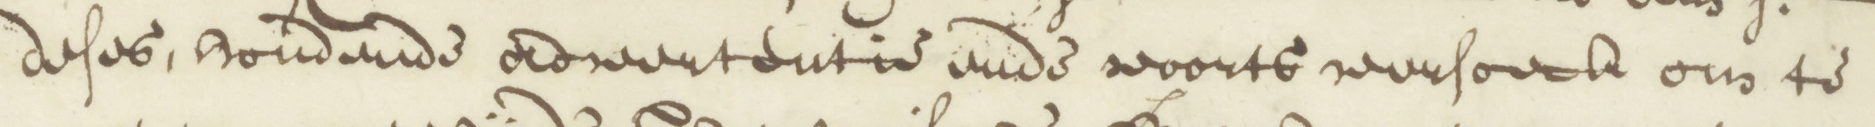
deses, houdende advertentie ende voorts versoeck om te
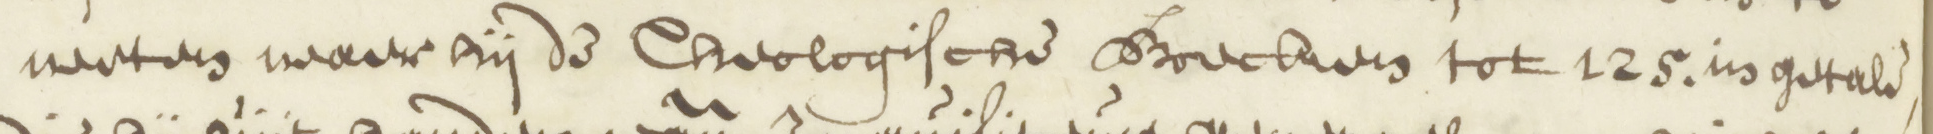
weten waer hij de Theologische Boecken tot 125. in getale
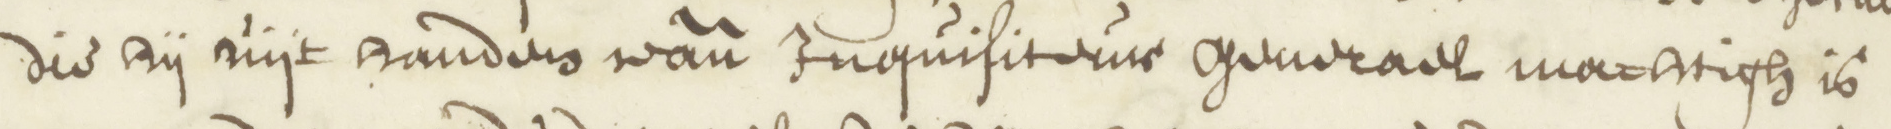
die hij uijt handen van Inquisiteur Generael machtigh is
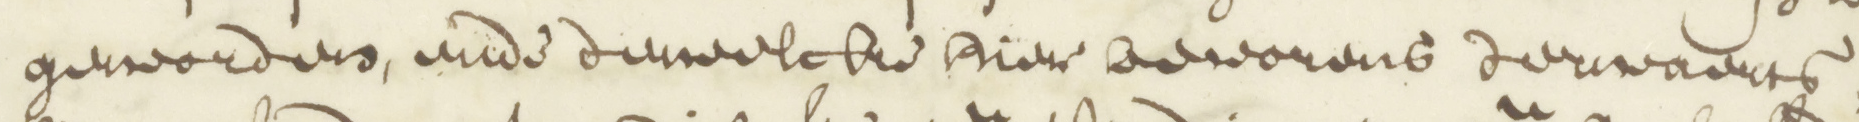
geworden, ende dewelcke hier bevorens derwaerts —
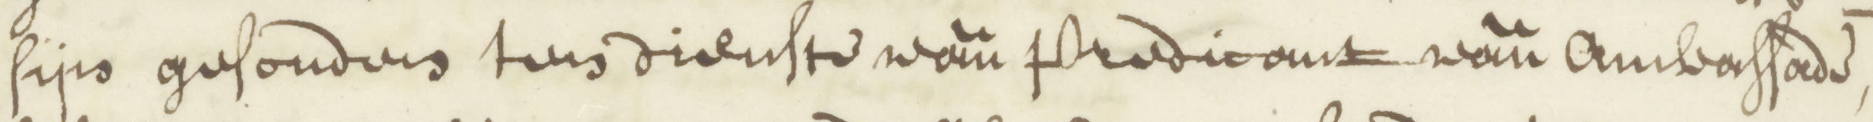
sijn gesonden ten dienste van Predicant van Ambassade
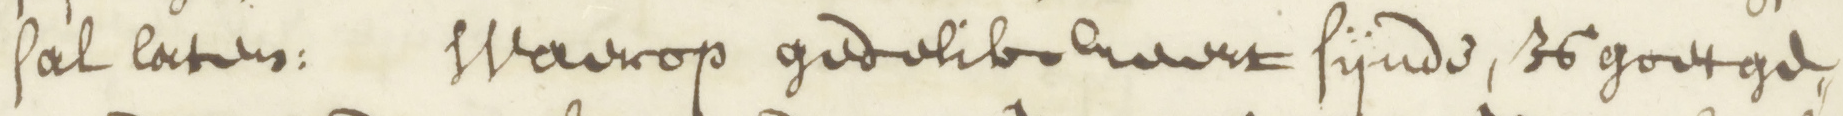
sal laten. Waerop gedelibereert sijnde, Is goet ge„
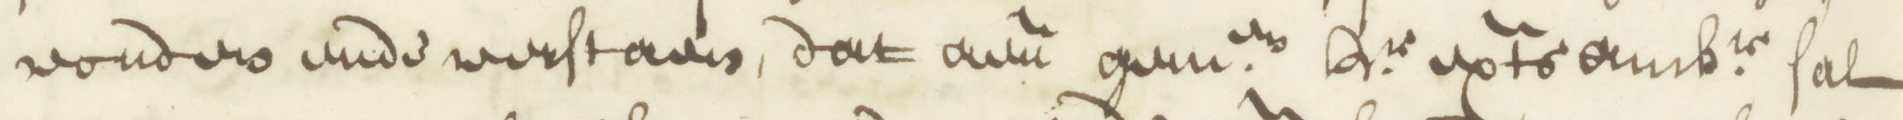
vonden ende verstaen dat aen gem.en Hr. exts amb.r sal
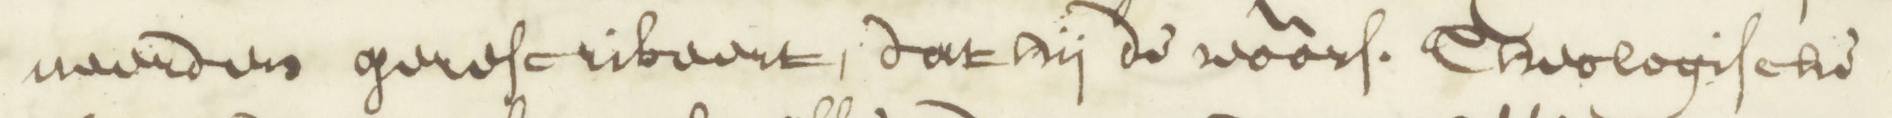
werden gerescribeert, dat hij de voors. Theologische
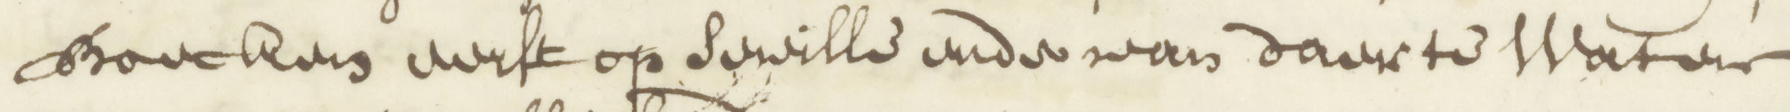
Boecken eerst op Seville ende van daer te Water
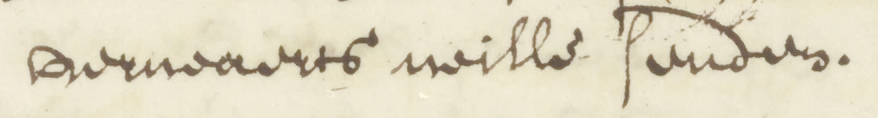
herwaerts wille senden.
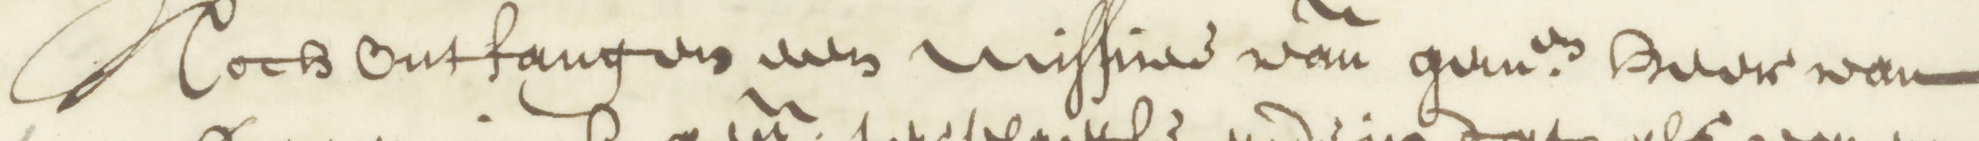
Noch ontfangen een missive van gem.en Heer van
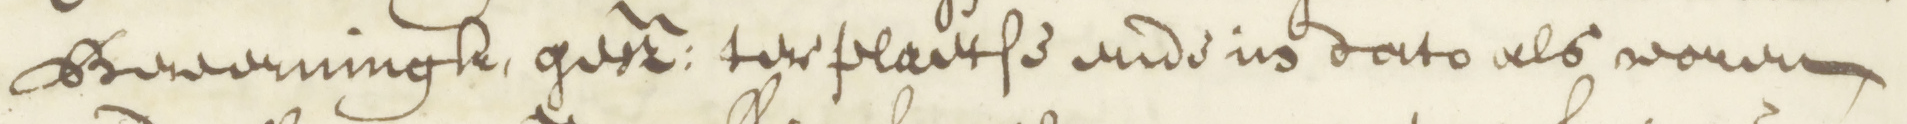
Beverningk gesr: ter plaetse ende in dato als voren
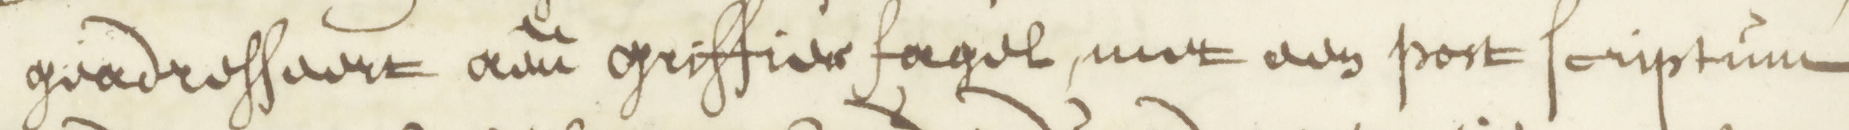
geadresseert aen griffier Fagel, met een post scriptum
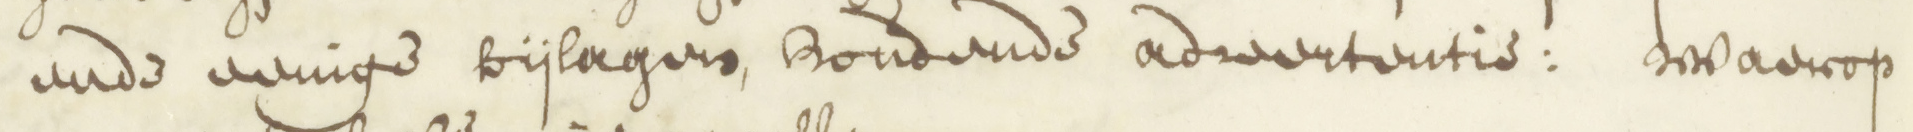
ende eenige bijlagen houdende advertentie. Waerop
